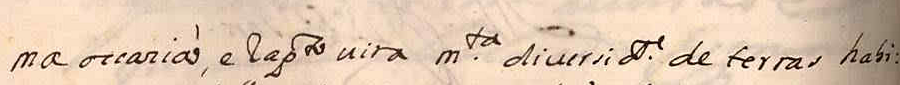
na occaziaõ, e Rapto uira m.ta diuersid.e de terras habi
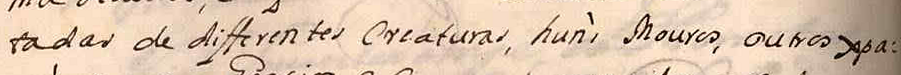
tadas de differentes Creaturas, hun̄s Mouros, outros xpa
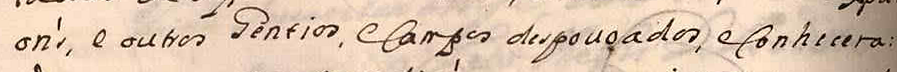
ons̄, e outros Gentios, e Campos despouoados, e Conhecera
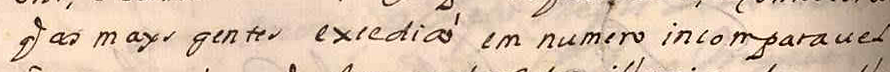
q̄ as mays gentes excediaõ em numero incomparauel
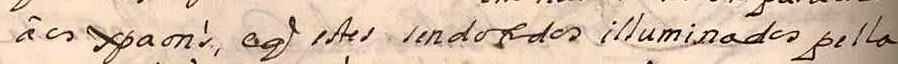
aos xpaons̄, e q̄ estes sendo todos illuminados pella
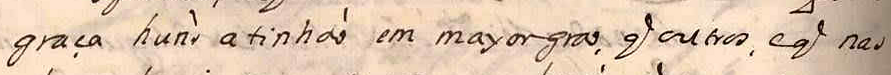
graça huns̄ a tinhaõ em mayor grao, q̄ outros, e q̄ nas
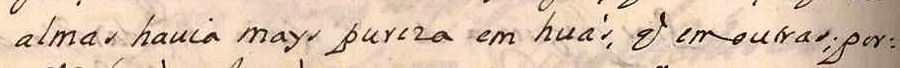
almas hauia mays pureza em huās, q̄ em outras; por
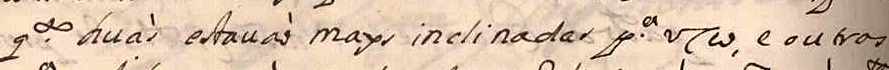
q.to huas̄ estauaõ mais inclinadas p.a o Ceo, e outras
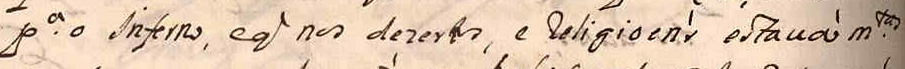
p.a o Inferno, e q̄ nos dezertos, e Religioens̄ estauaõ m.tas
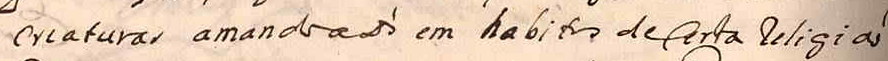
criaturas amando a Ds̄ em habitos de Certa Religiaõ
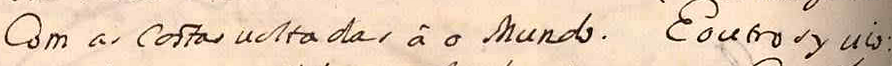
Com as Costa uoltadas âo Mundo. E outrosy uio
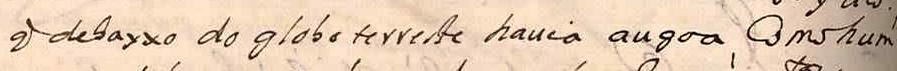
q̄ debayxo do globo terreste hauia augoa Como hum
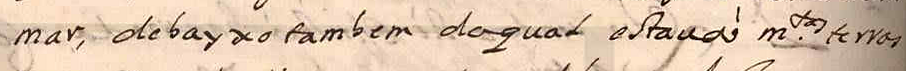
mar, debayxo tambem do qual estauaõ m.tas terras
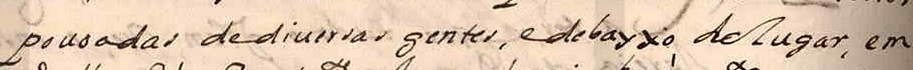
pouoadas de diuersas gentes, e debayxo do lugar, em
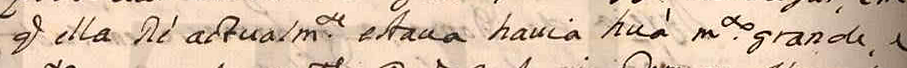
q̄ ella Ré actualm.te estaua hauia huā m.to grande, e
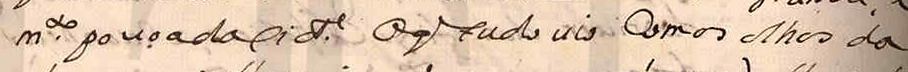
m.to pouoada Cid̄.e O q̄ tudo uio Com os olhos da
